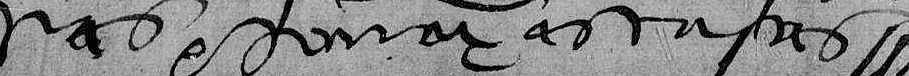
rias e tomar as casas //
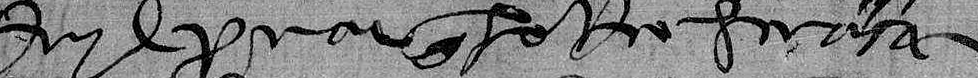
Emde ꝓuar q̄ ho Reo he casa
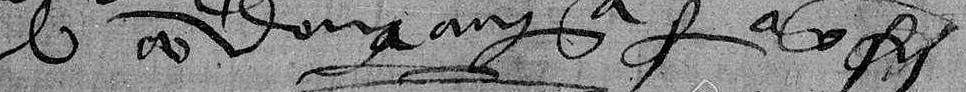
do c̄o dona anta fa q̄ foj
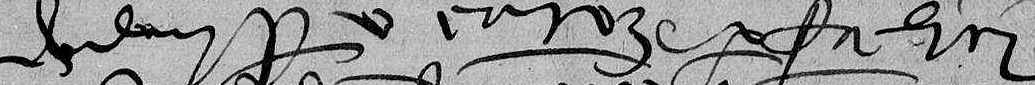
de dom ꝑo caroz e ꝑ faljcj
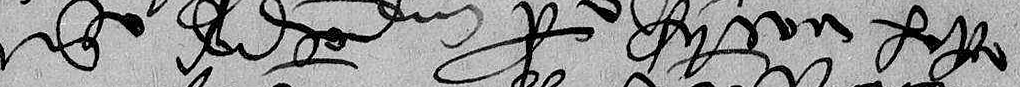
mto do dito dom ꝑo fycou ho Reo
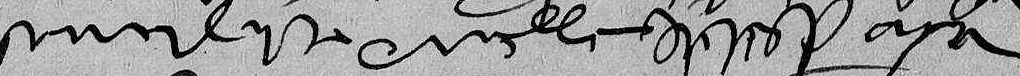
seu erdeyro e nelle trespasa
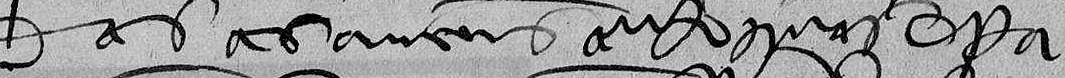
das as auções autotyuas e pa
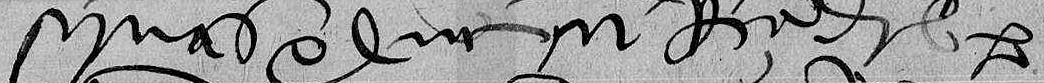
syuas e deue ser Recēdjdo ho
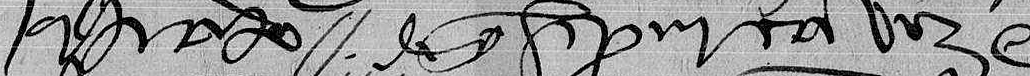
ꝯtrato //. do q̄ he ꝓujca voz e
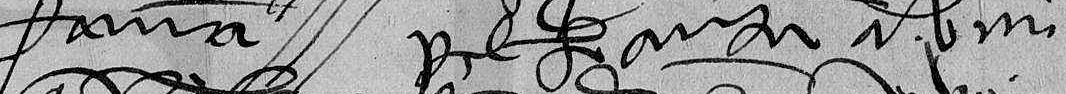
fama /// pede ho autor a .v m.
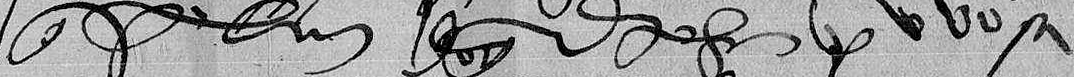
q̄ p̄o bem do q̄ dito he p̄o vosa
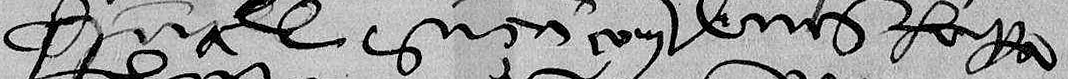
fjnall snç̄a comdenes ho Reo
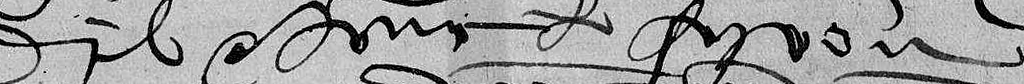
djdo e torne ho foro ou
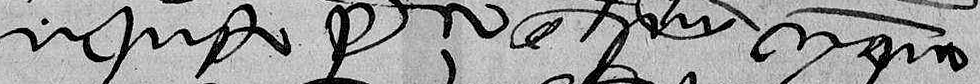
seu Justo p̄ço q̄ sam cynquo
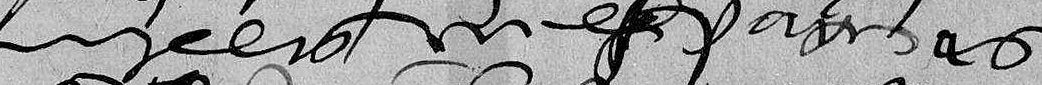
mjll rs ou lhe page as
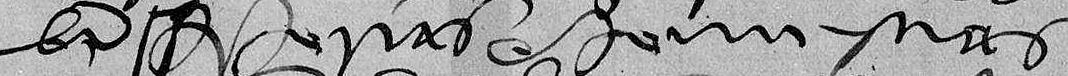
bēfjtorias e tome suas
